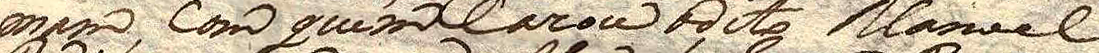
mam, com quem cazou o dito Manoel
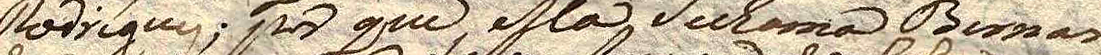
Rodrigues; porque ella se chama Bernar
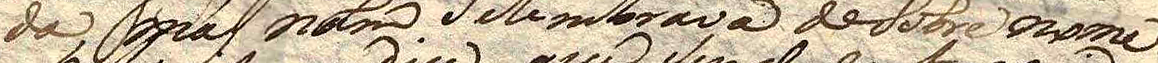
da, mas nam se Lembrava do sobrenome.
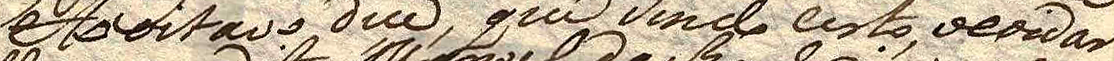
Ao oitavo dice, que sendo certo, ovidar
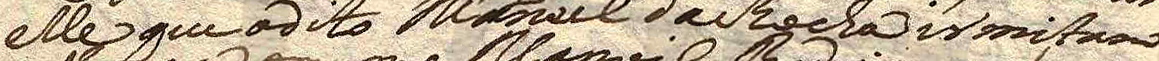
elle que o dito Manoel da Rocha irmitam
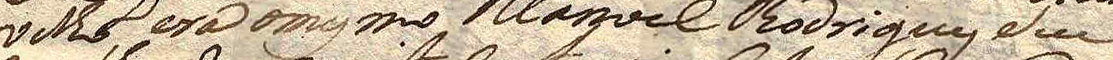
velho, era o mesmo Manoel Rodrigues seu
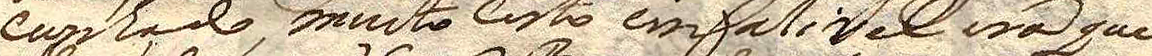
cunhado, muito certo e infalivel era que
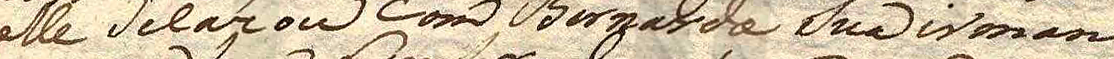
elle se cazou com Bernarda Sua irmam;
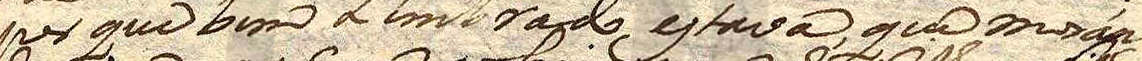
por que bem Lembrado estava, que moran
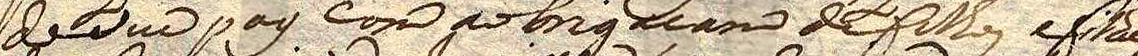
do seu pay com a obrigaçam de filhos e filhas
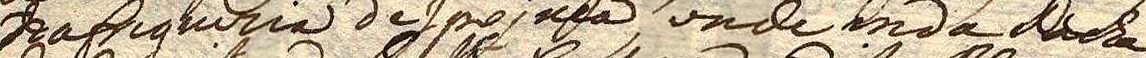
na freguezia de Ipojuca, onde inda seacha
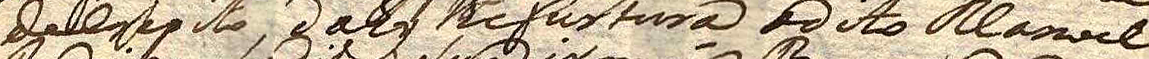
deCrepito, dahy lhe furtara o dito Manoel
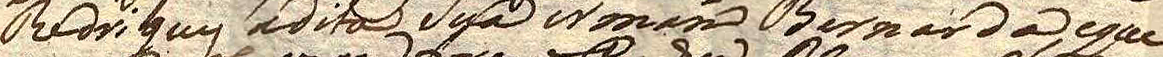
Rodrigues a dita sua irmam Bernarda, e que
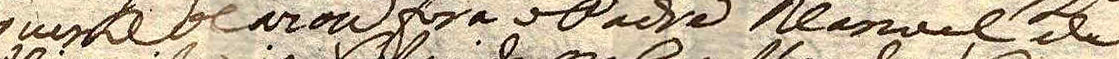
quem o cazou fora Padre Manoel de
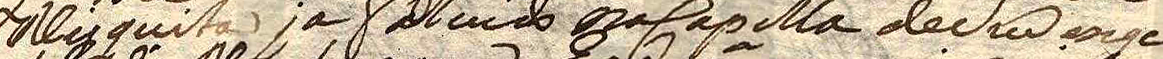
Misquita ja falecido na Capella de seu enge
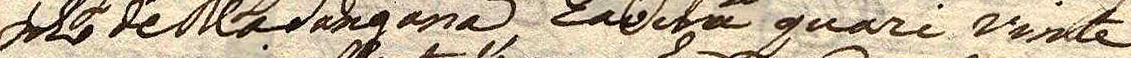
nho de Masangona, haverã quazi vinte
